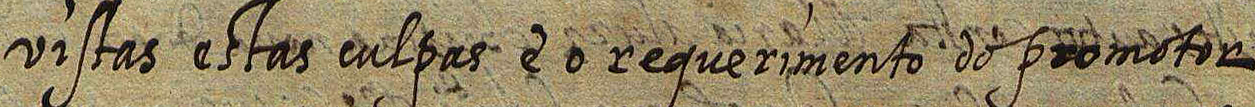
vistas estas culpas e o requerimento do promotor
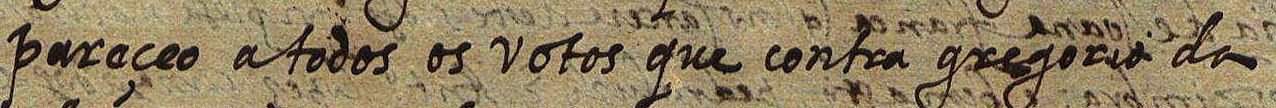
pareçeo a todos os votos que contra gregorio da
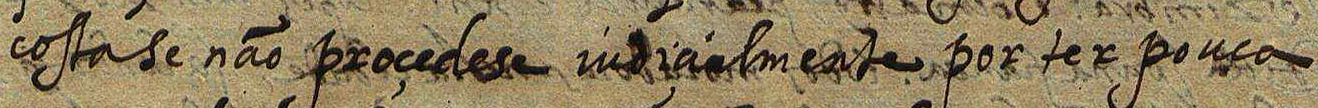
costa se não proçedese iudiçialmente por ter pouca
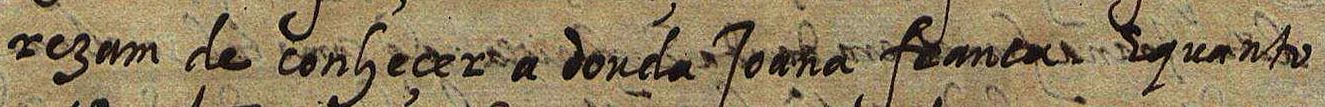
rezam de conheçer a douda Joana franca E quanto
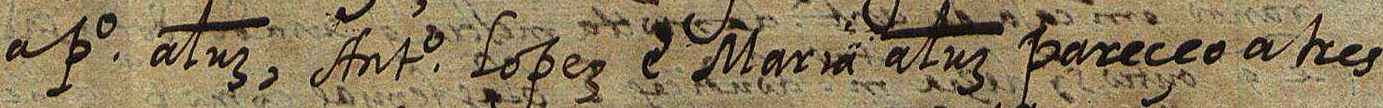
a po. al̄uz, Anto. Lopez e Maria al̄uz pareçeo a tres
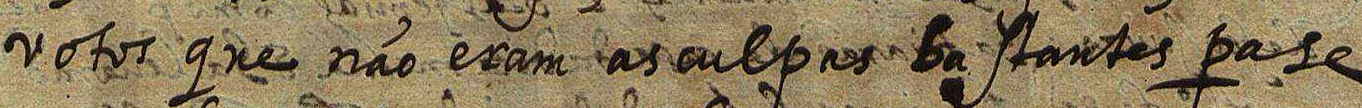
votos que não eram as culpas bastantes ꝑa se
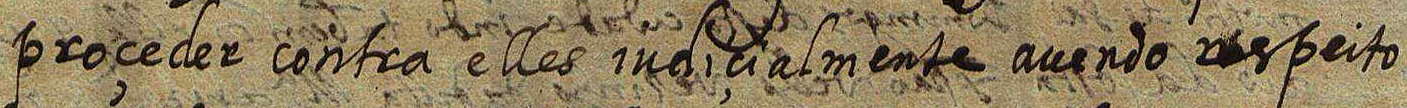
proçeder contra elles iudiçialmente auendo respeito
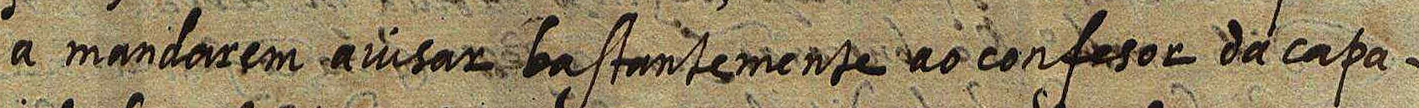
a mandarem auisar bastantemente ao confesor da capa
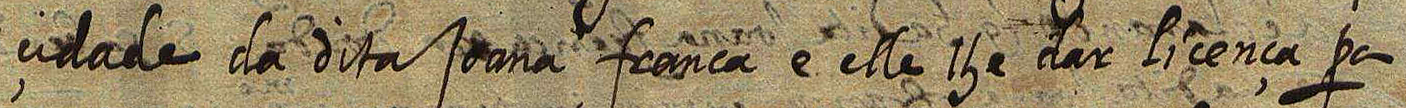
çidade da dita Joana franca e elle lhe dar licença ꝑa
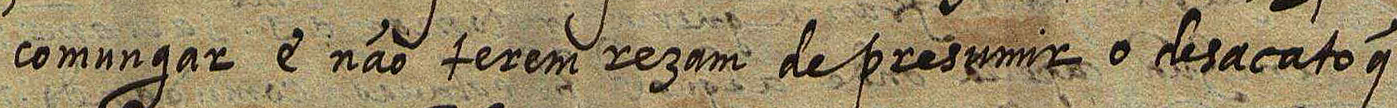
comungar e não terem rezam de presumir o desacato q̄
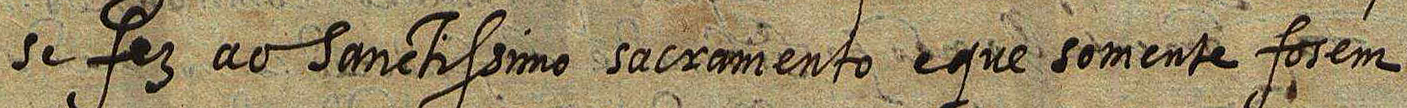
se fez ao Sanctissimo sacramento e que somente fosem
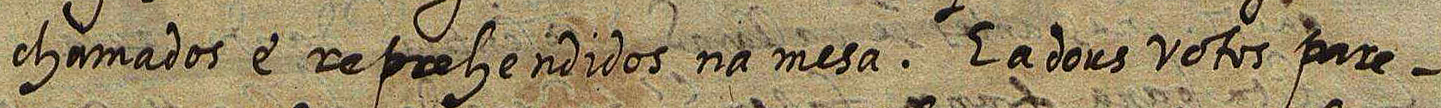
chamados e reprehendidos na mesa. E a dous votos pare
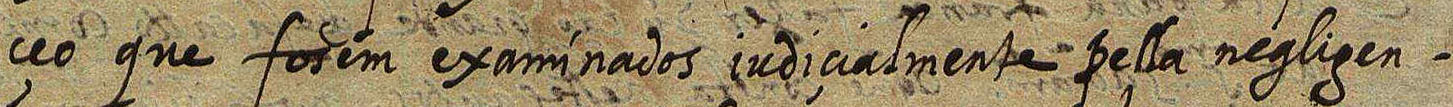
çeo que fosem examinados iudiçialmente pella negligen
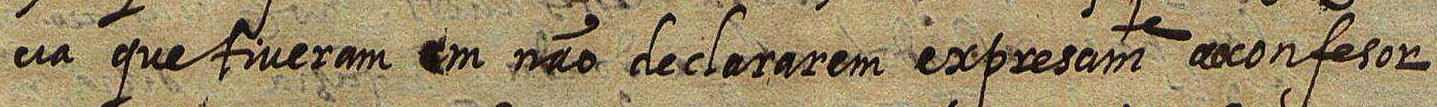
cia que tiueram em não declararem expresamte ao confesor
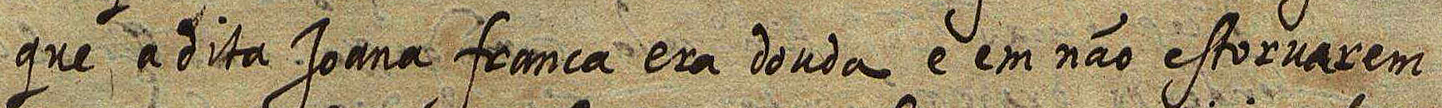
que a dita Joana franca era douda e em não estoruarem
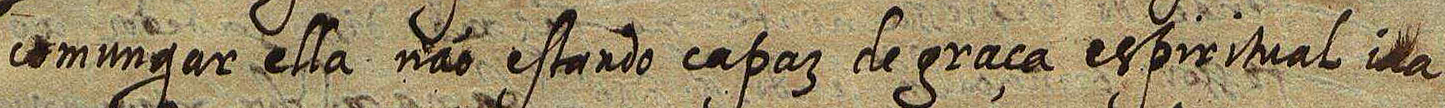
comungar ella não estando capaz de graça espiritual i_a
